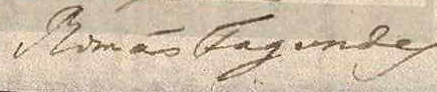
Romaõ Fagundes
